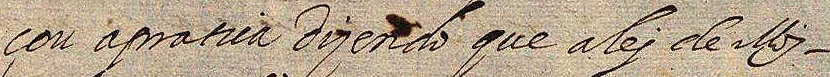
çou a pratica dizendo que a lej de Moj
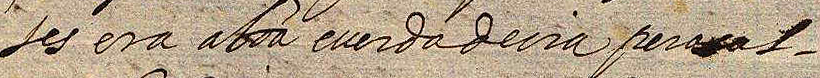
ses era a boa̅ e uerdadeira pera sal
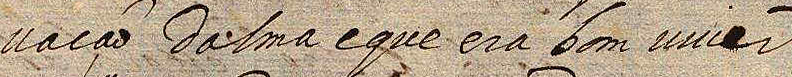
uação dalma e que era bom uiuer
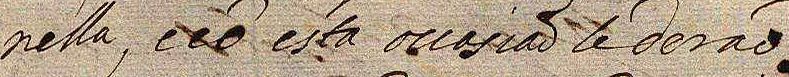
nella, e co̅ esta occasião se deraõ
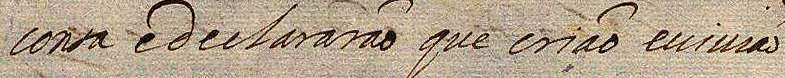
conta e declararão que crião e uiuiaõ
